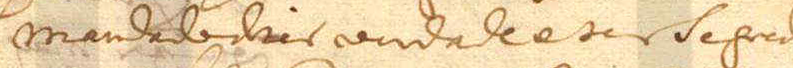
mandado dizer verdade e ter segred
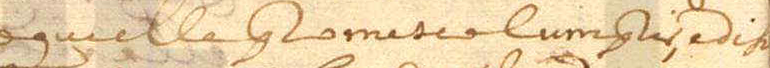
o que ella prometeo Cumprir, e diss
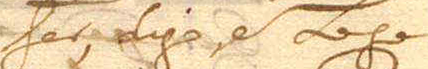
ser, digo, e Logo
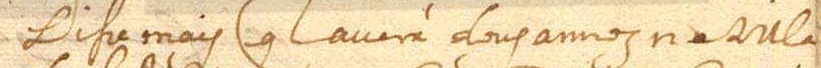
Disse mais q̄ haverá dous annos na Villa
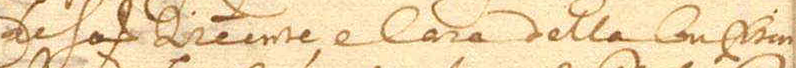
de saõ Vicente, e Caza della Confiten
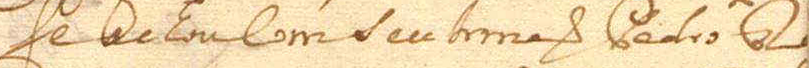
se achou Com seu Irmaõ Pedro R
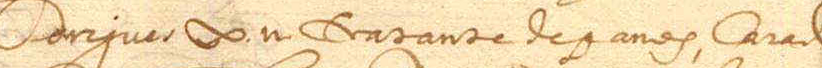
drigues x. n. tratante de panos, Cazad
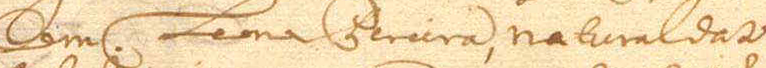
Com Leonor Pereira, natural da v.
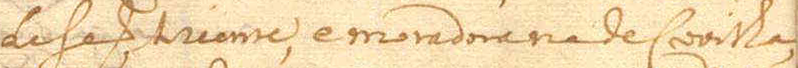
de saõ vicente, e moradora na de Covilha,
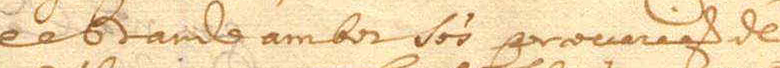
e estando ambos sós por occaziaõ de
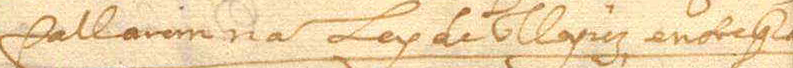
fallarem na Ley de Moyzez, entre pr
